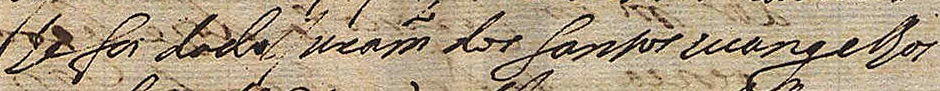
he foi dado Juramto dos santos euangelhos
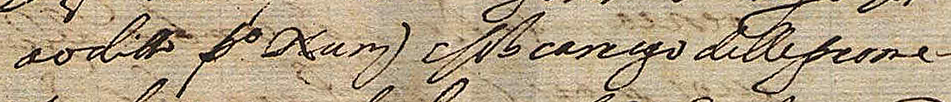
ao ditto po Nunz̄ e sob carrego delle prome
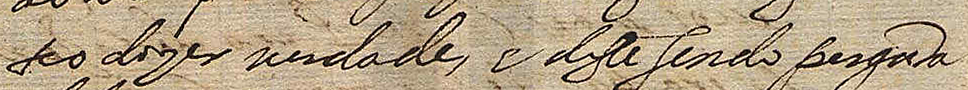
teo dizer uerdade, E disse sendo pergūta
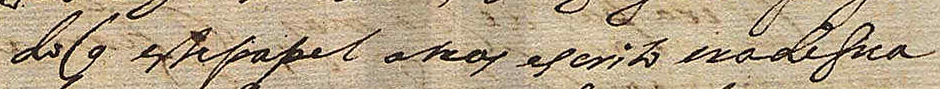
do q̄ este papel atras escrito era de sua
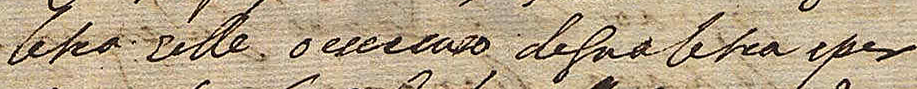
letra E elle o escreueo de sua letra e per
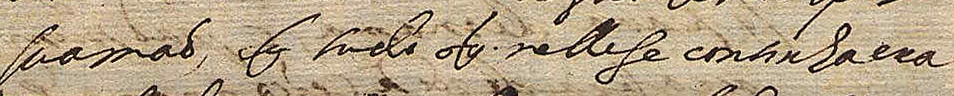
sua maõ, e q̄ tudo o q̄ nelle se continha era
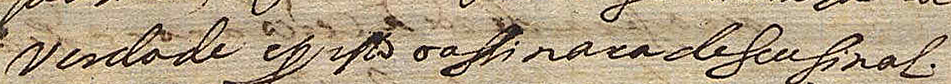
verdade e ꝑ isto o assinara de seu sinal
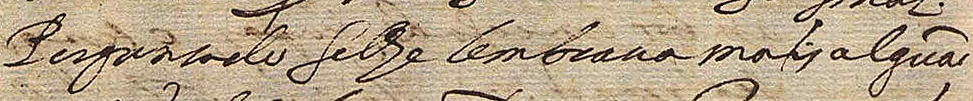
Perguntado se lhe lembraua mais algūa
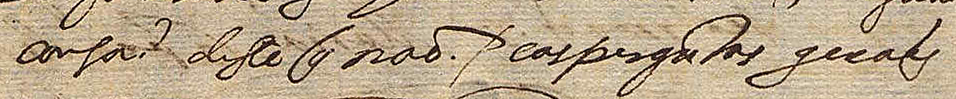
cousa? disse q̄ naõ. / e as pergūtas geraes
